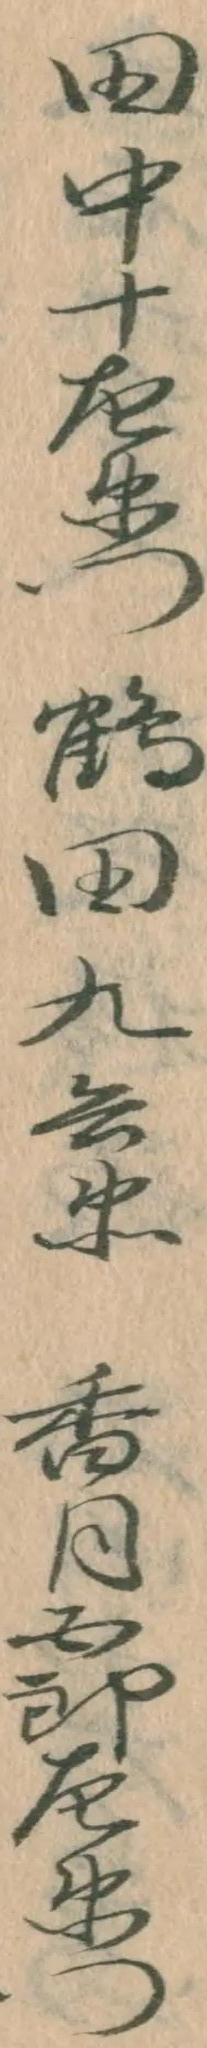田中十左衛門鶴田九兵衛香月五郎左衛門
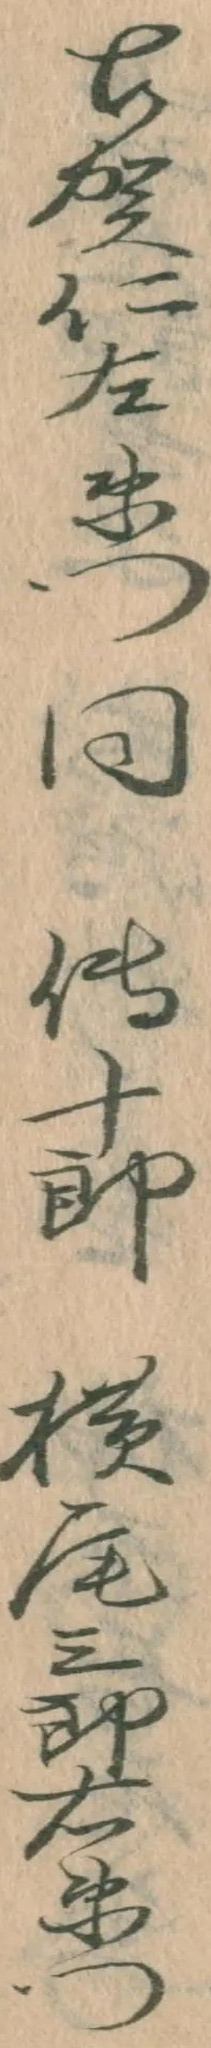古賀仁左衛門同伝十郎横尾三郎右衛門
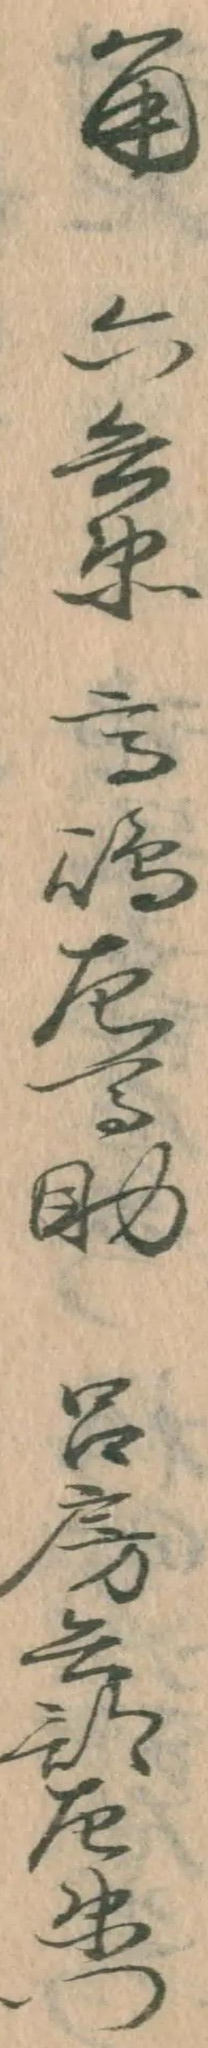角六兵衛高島左馬助呂房兵部左衛門
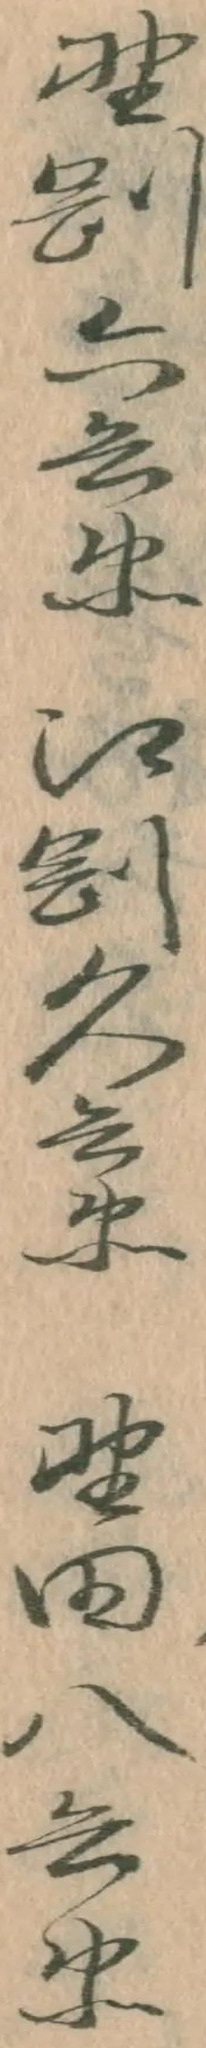野別六兵衛江別久兵衛野田八兵衛
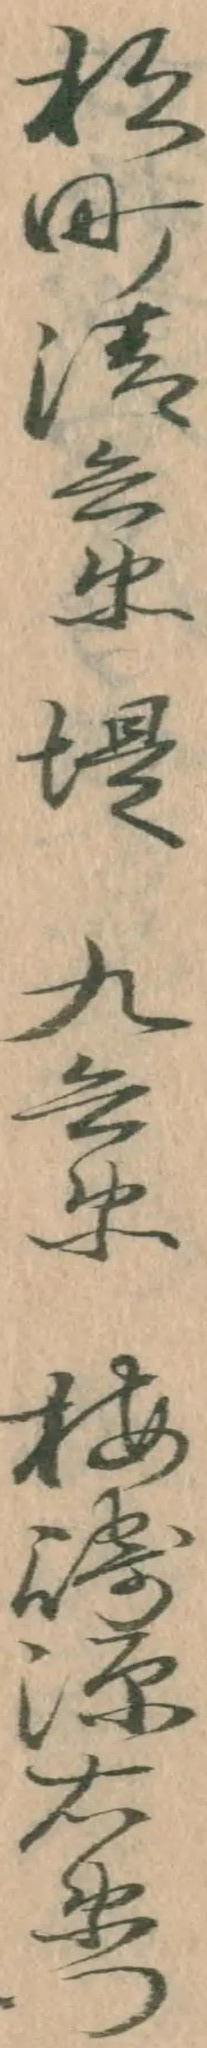杉町清兵衛堤九兵衛梅崎源右衛門
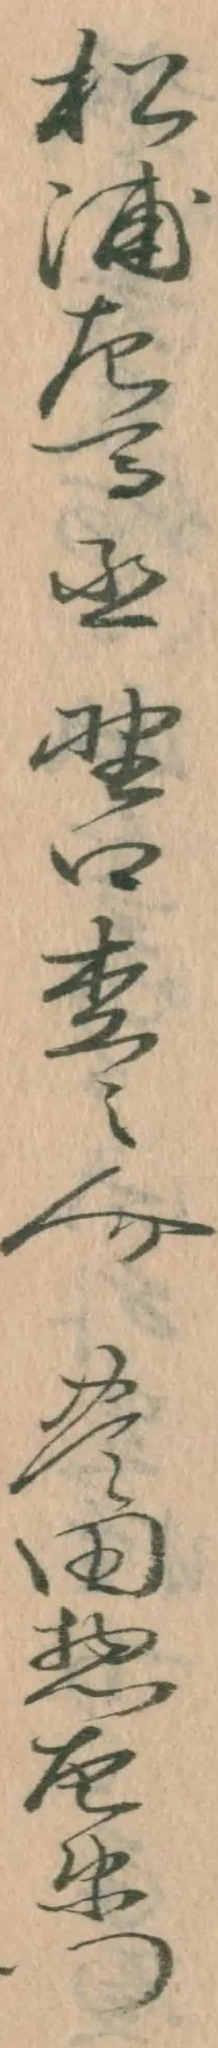松浦左馬丞野口杢之介豊田惣左衛門
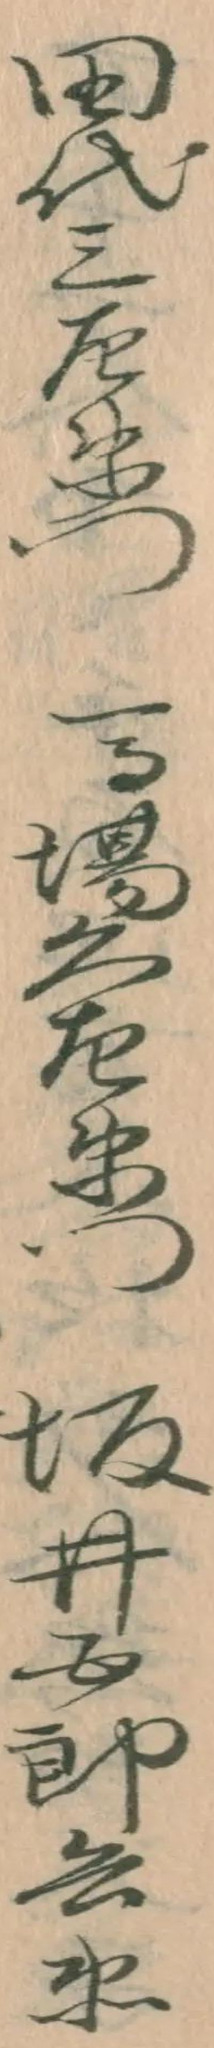田代三左衛門馬場久左衛門坂井五郎兵衛
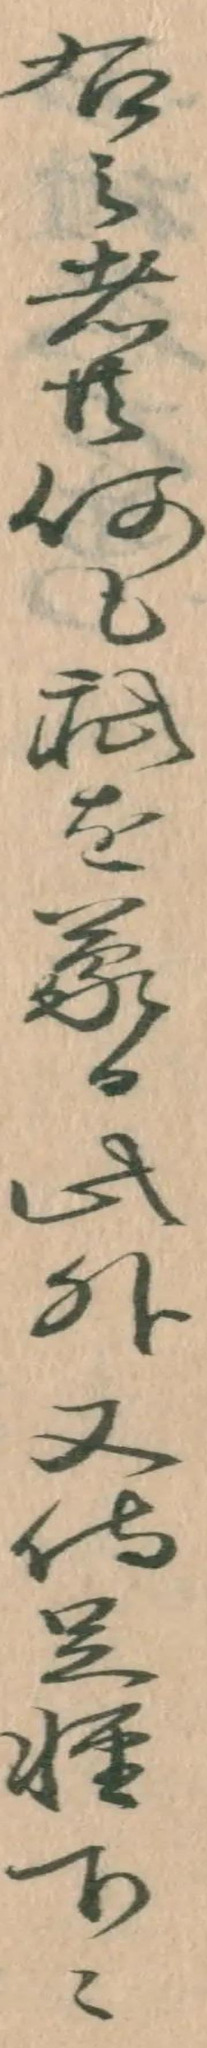右の者共何も疵を承る此外又侍足軽下々
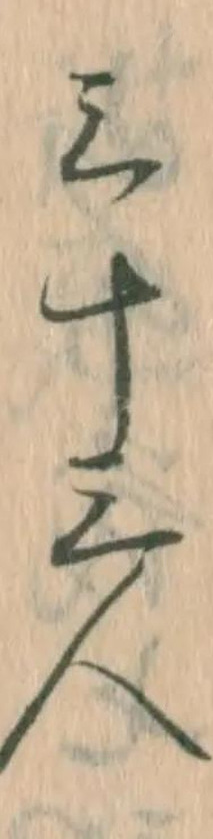三十三人
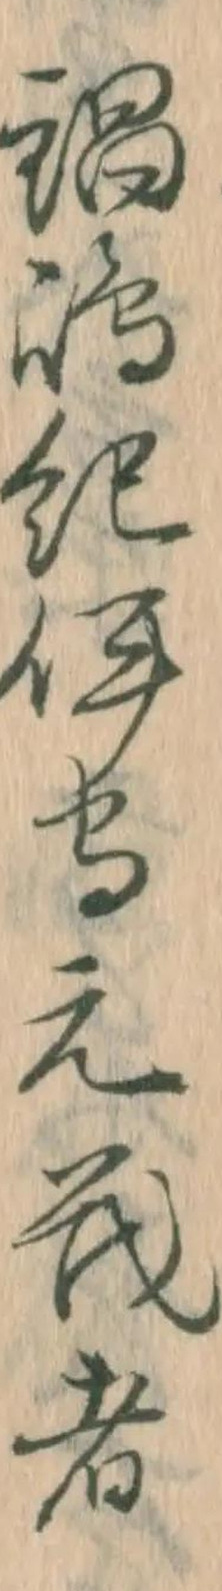鍋島紀伊守元茂者
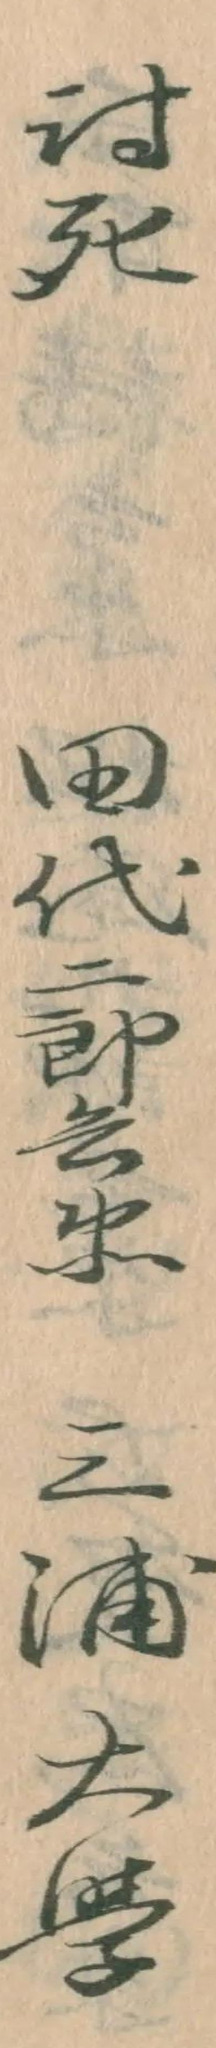討死田代二郎兵衛三浦大学
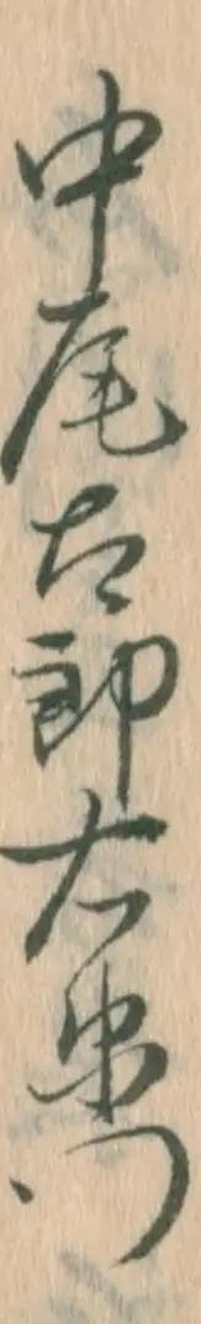中尾太郎右衛門
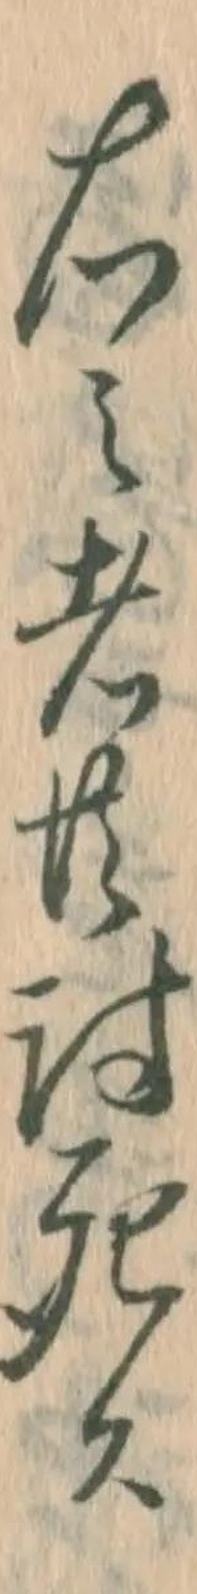右之者共討死す
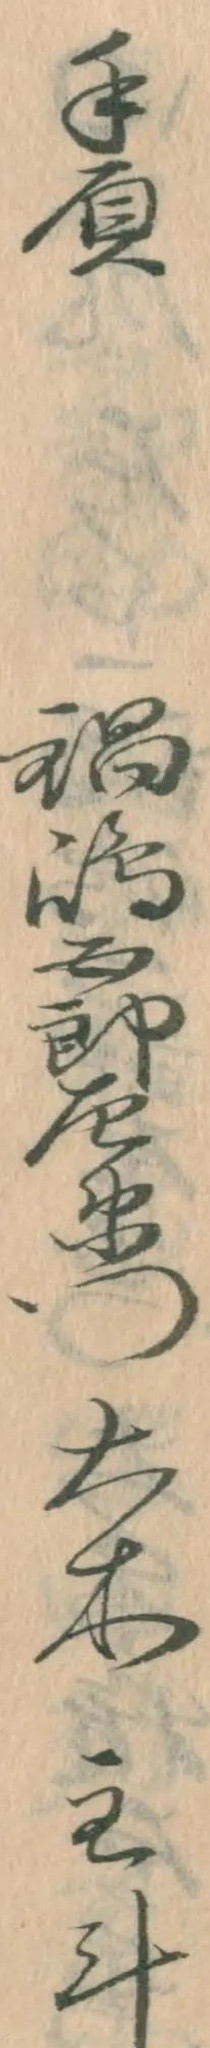手負鍋島五郎左衛門大木主計の

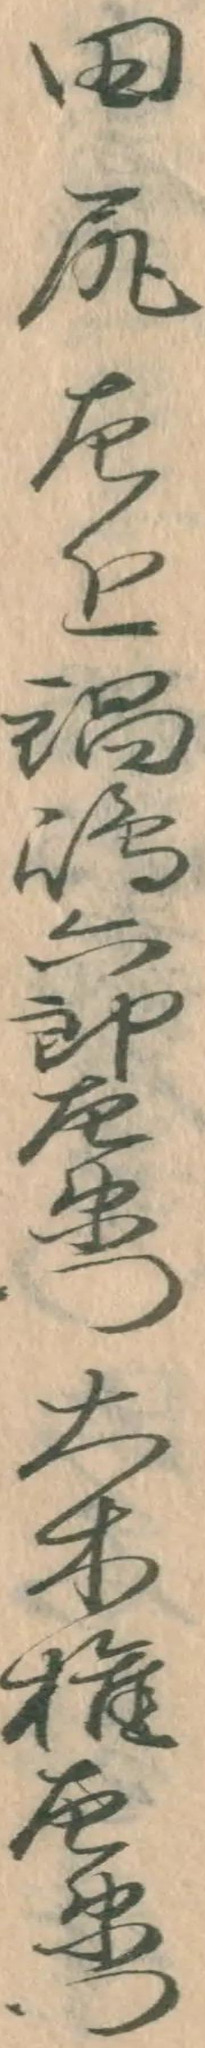田尻佐近鍋島六郎左衛門大木権左衛門
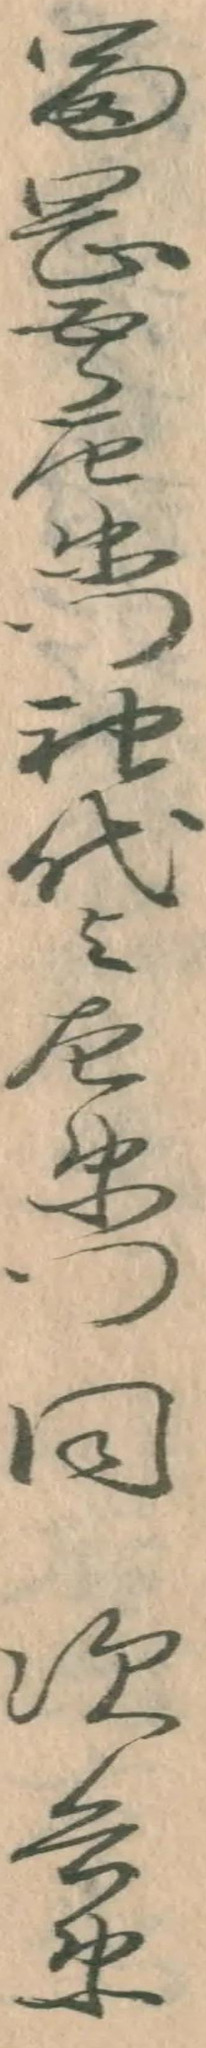冨岡五郎左衛門神代杢右衛門同次兵衛
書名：切支丹御退治記 49巻. [9]
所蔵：国立国会図書館 National Diet Library, JAPAN
